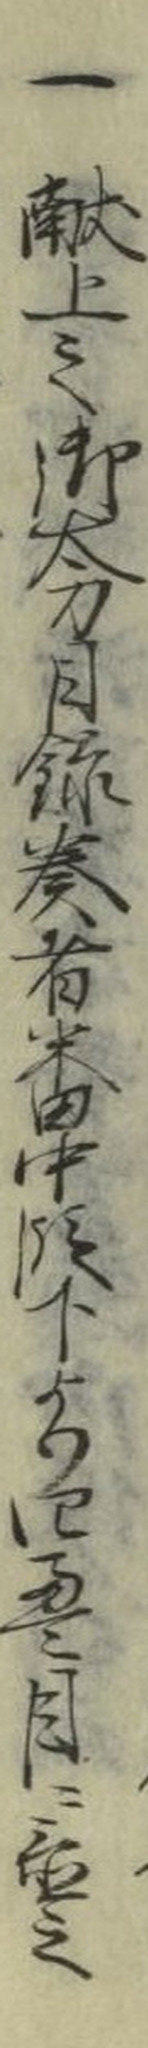献上之御太刀目録奏者番中段下より四畳目に置之
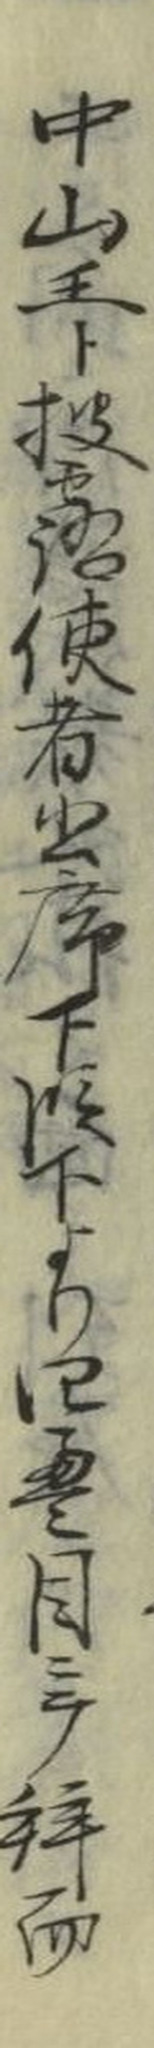中山王と披露使者出席下段下より四畳目にて拝而
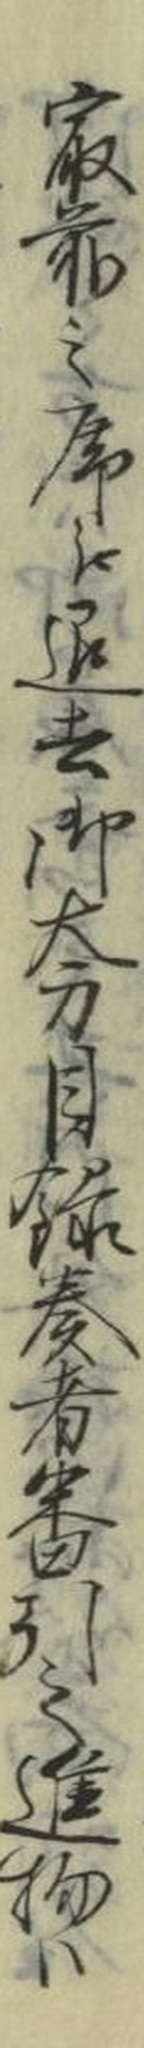最前之席え退去御太刀目録奏者番引之進物は
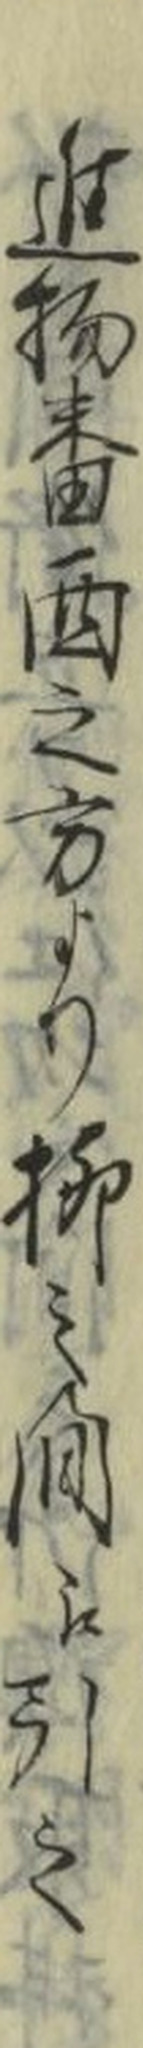進物番西之方より柳之間え引之
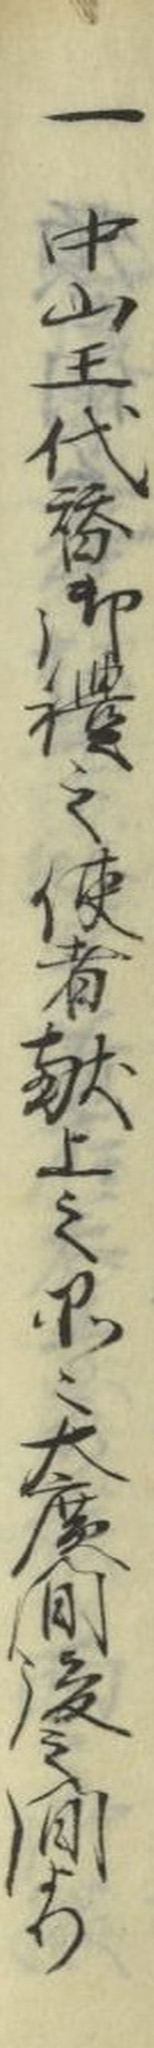一中山王代替御礼之使者献上之品々大広間後之間より
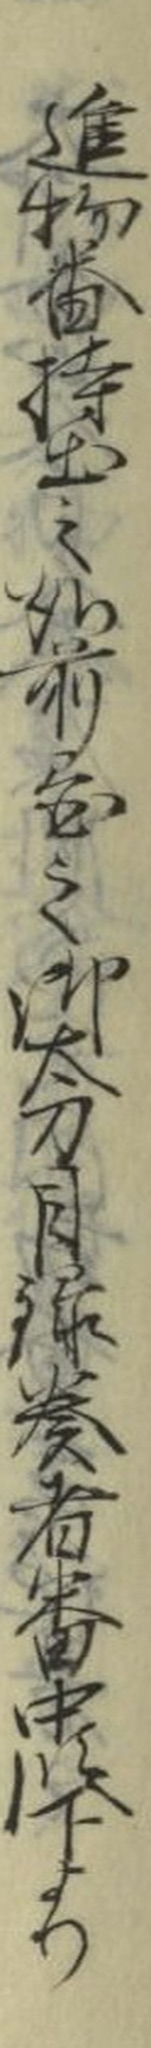進物番持出之如前置之御太刀目録奏者番中段下より
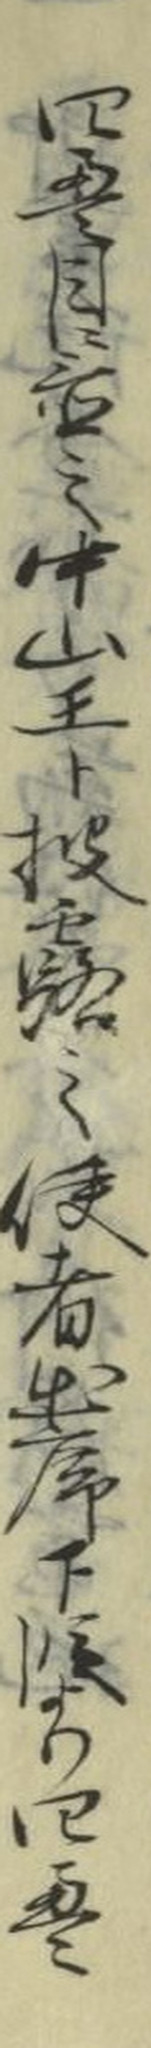四畳目に置之中山王と披露之使者出席下段より四畳
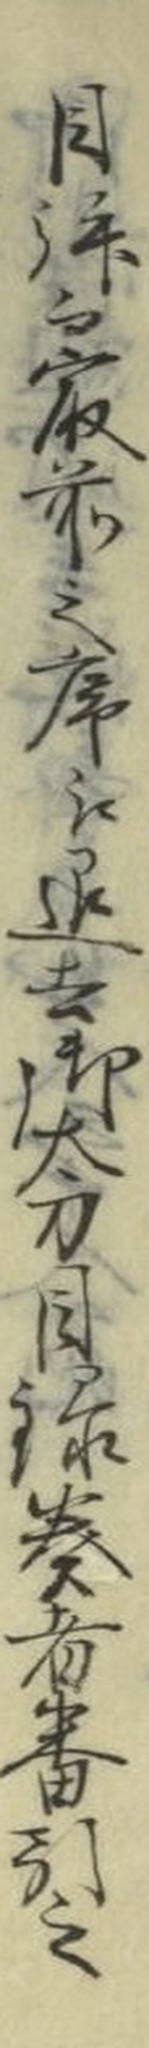目拝而最前之席え退去御太刀目録奏者番引之
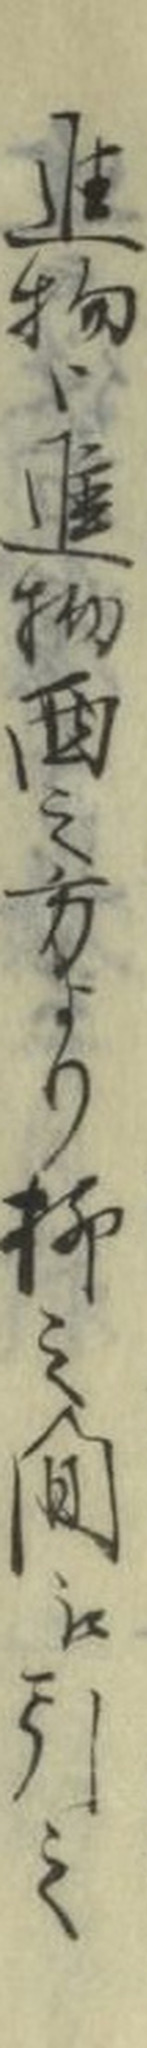進物は進物西之方より柳之間え引之
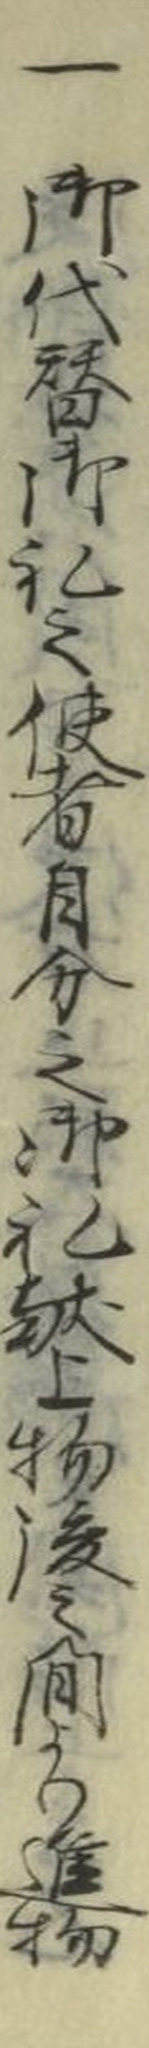一御代替御礼之使者自分之御礼献上物後之間より進物
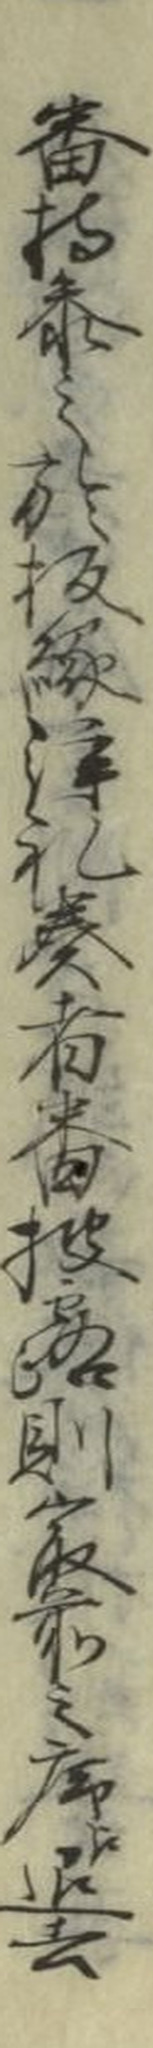番持参之於板縁拝礼奏者番披露則最前之席え退去
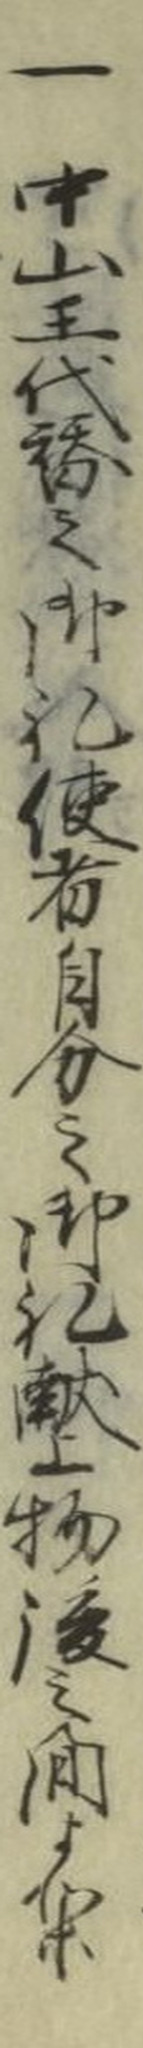一中山王代替之御礼使者自分之御礼献上物後之間より
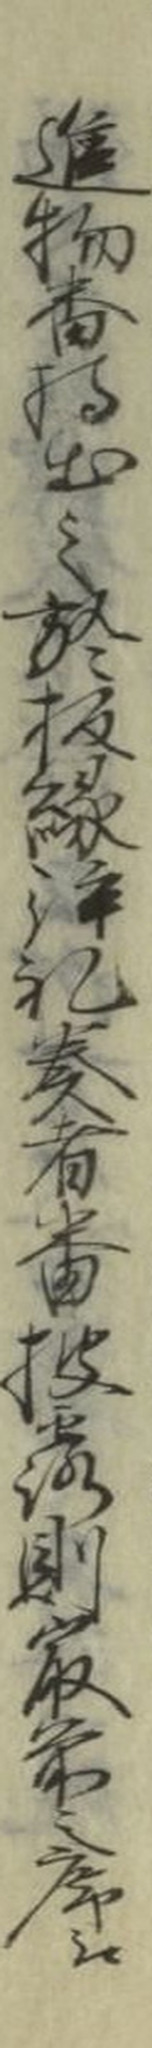進物番持出之於板縁拝礼奏者番披露則最前之席え
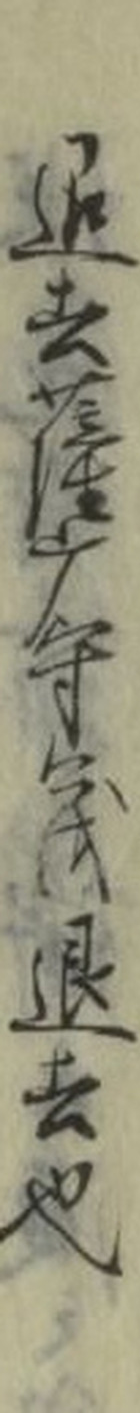退去薩摩守も退去也
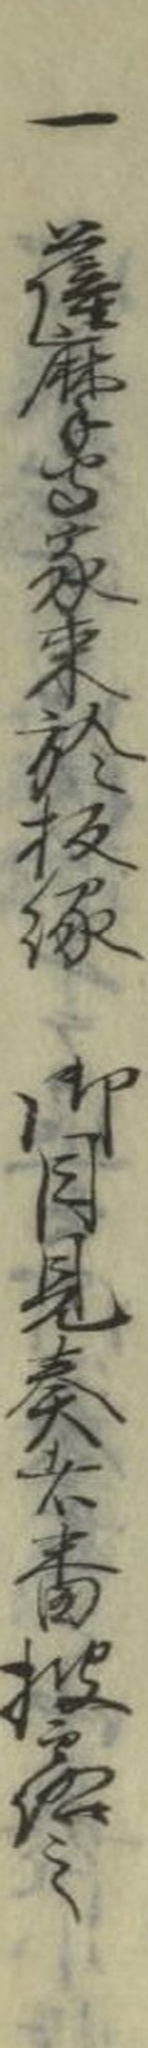一薩摩守家来於板縁御目見奏者番披露之
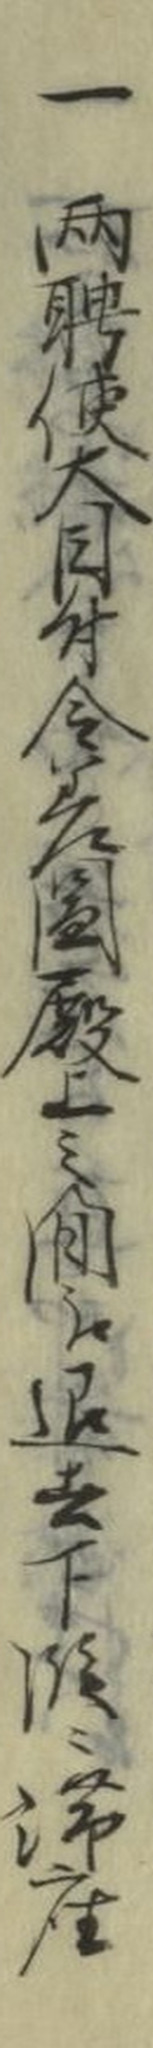一両聘使大目付令差図殿上之間え退去下段に滞座
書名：宝永七庚寅年琉球国来聘使日記
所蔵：University of the Ryukyus Library
